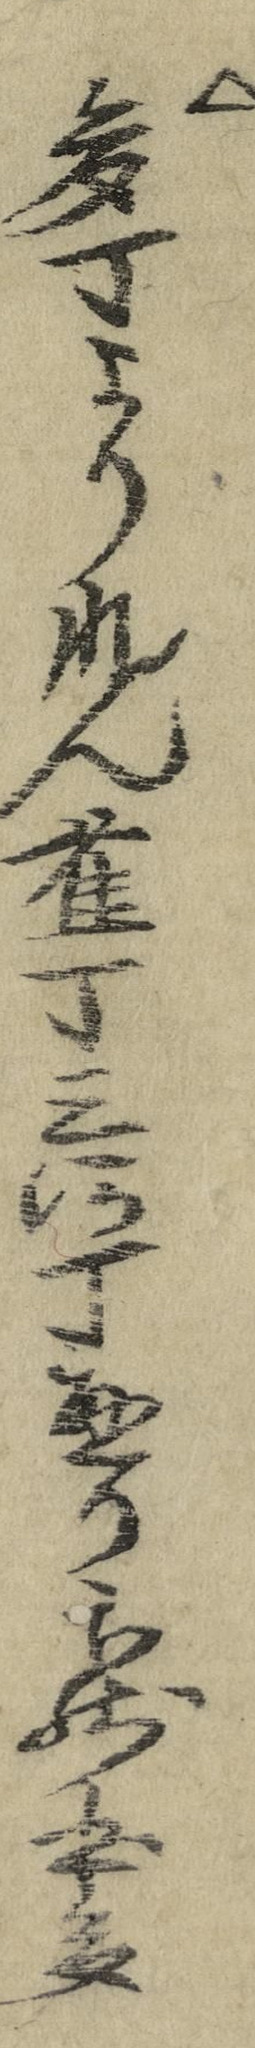多丁よりれん雀丁三河丁通り不残本多
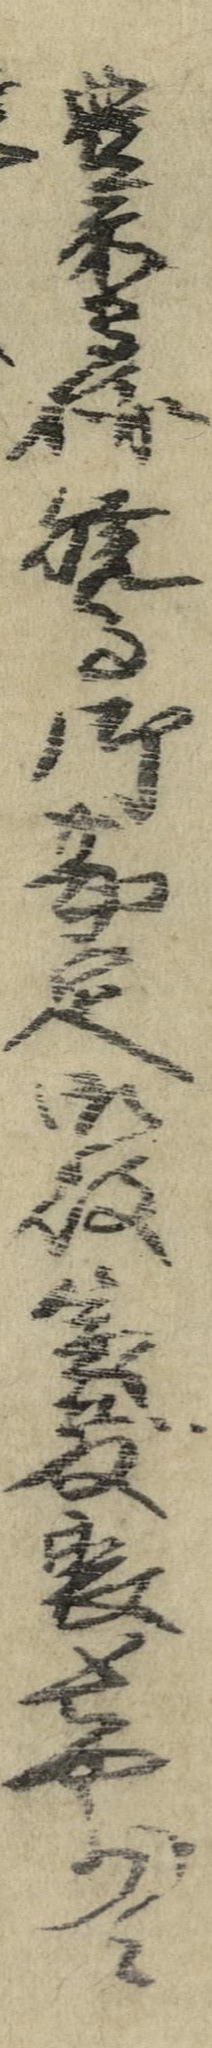豊前守様焼る御勘定御殿屋敷裏長や少々
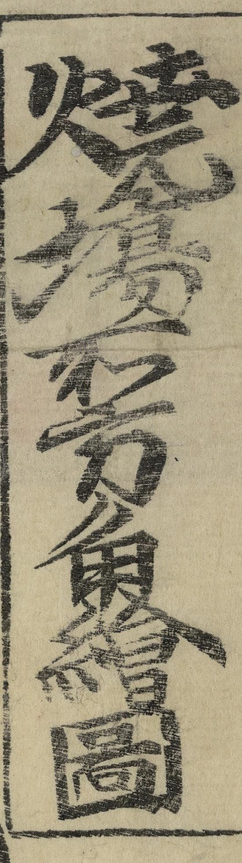焼場所方角絵図
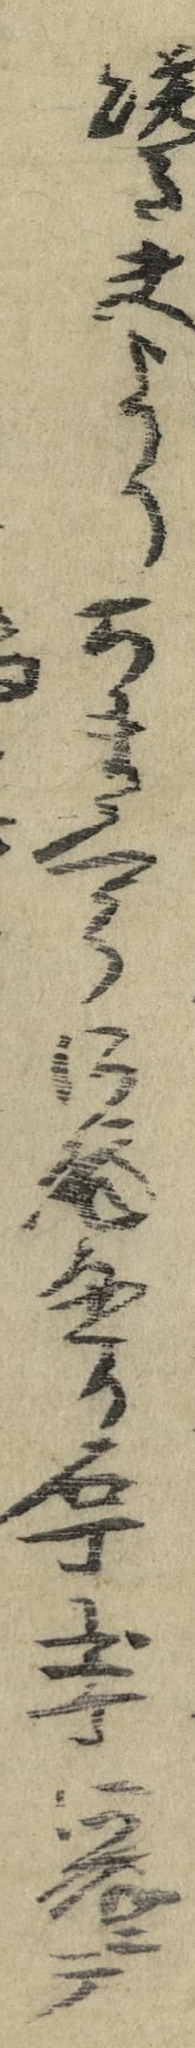焼る夫よりかまくら河岸通り石丁土丁河岸二テ
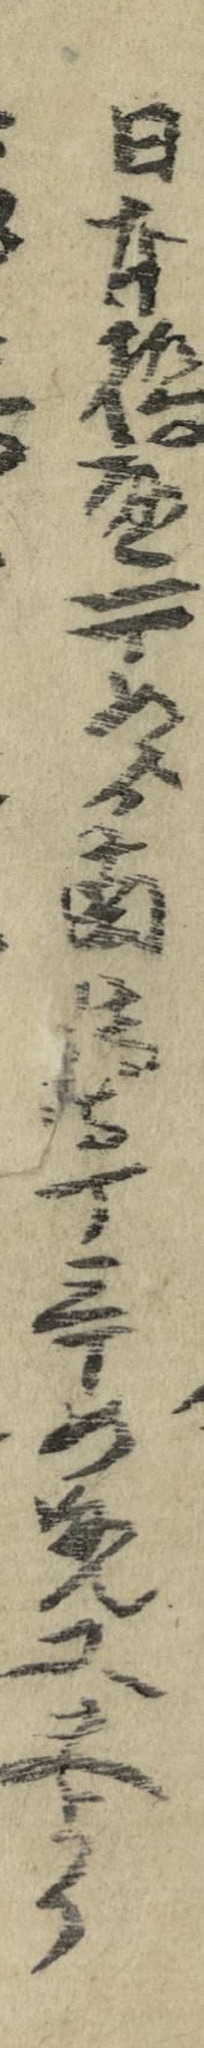日本橋通一丁目メゟ南伝馬丁三丁めあん又夫より
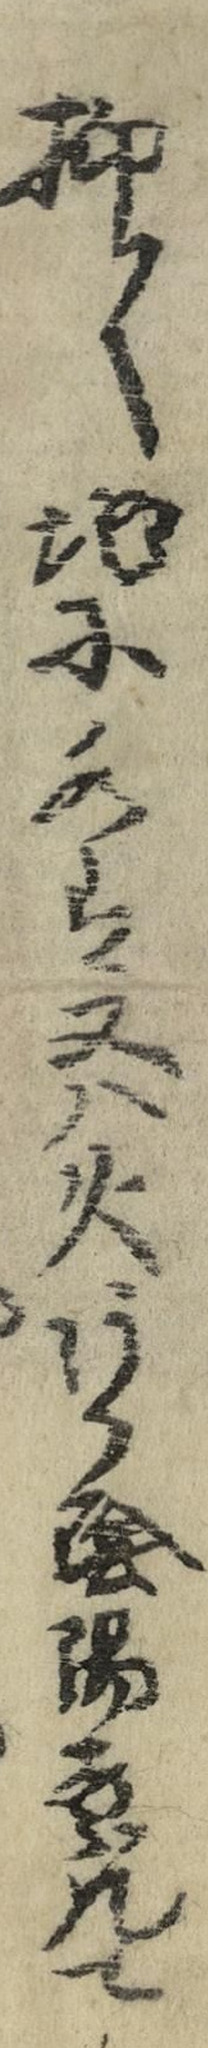抑〳〵地に水有又は火あり陰陽あふれて
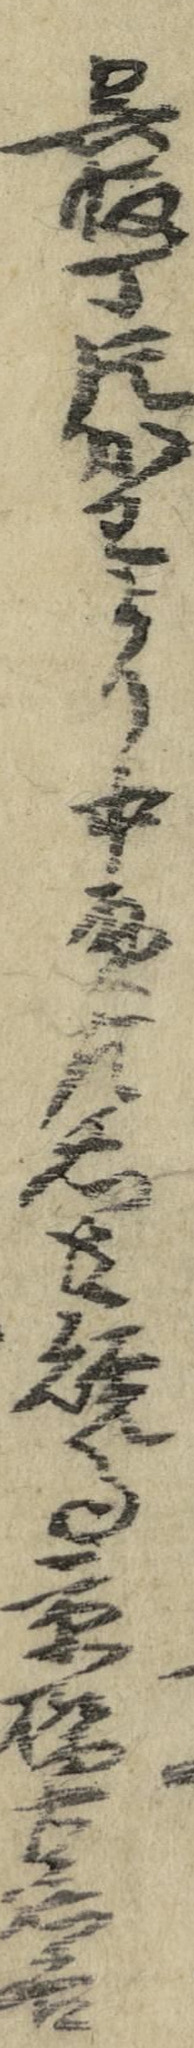呉服丁片かわより中通左右共焼る京橋
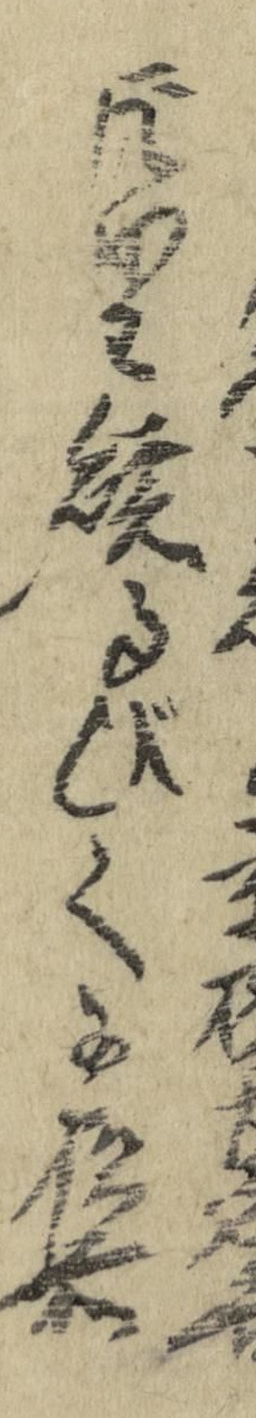片かわ焼るびくに松前
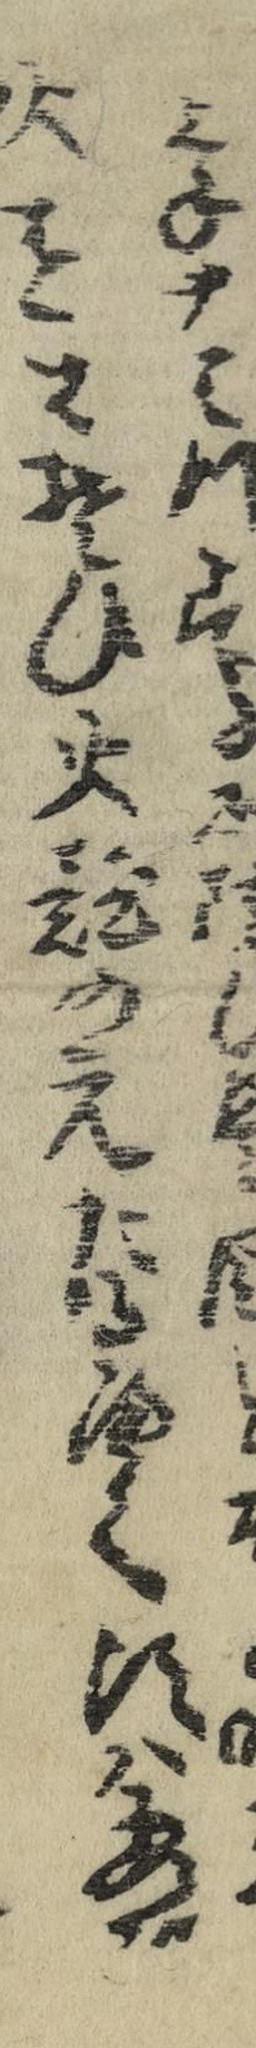火をさそひ火難の元たるへく頃は安政
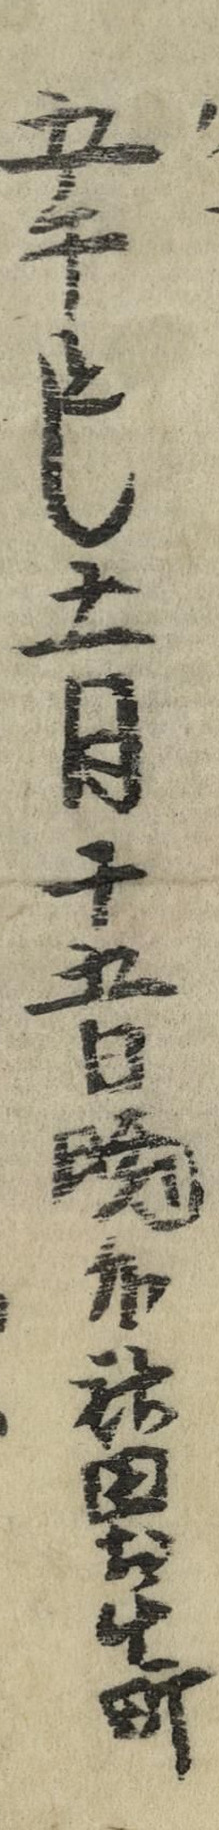五午とし十一月十五日暁外神田相生町
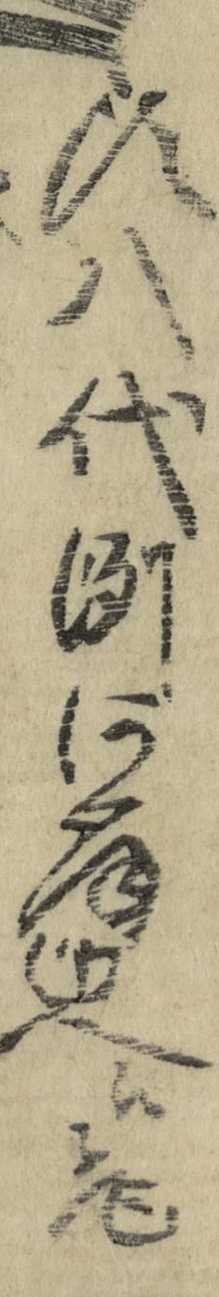頃八代例河岸辺え飛
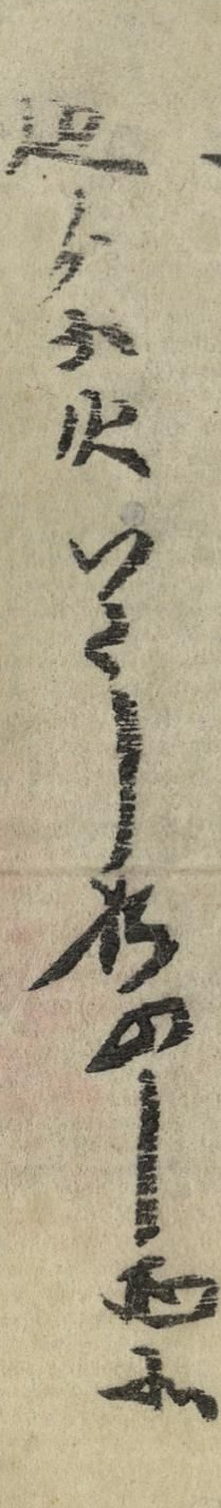辺ゟ出火いたし折ふし西北
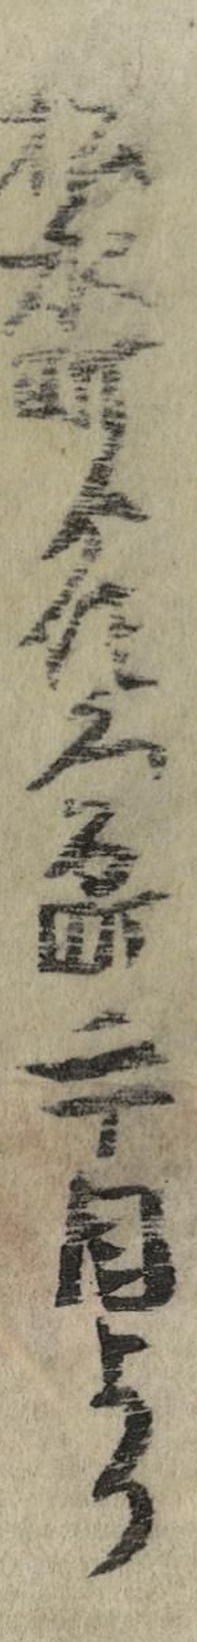松永町ゟ佐久間町二丁目より
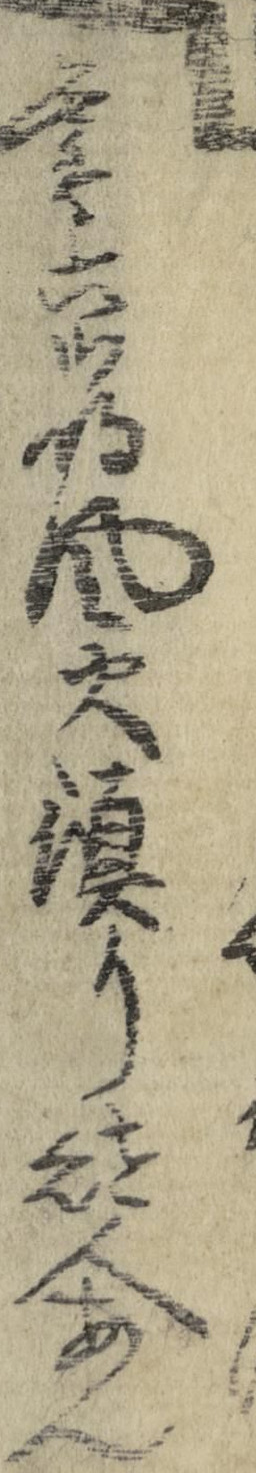暮六ッ時風火鎮り諸人あん
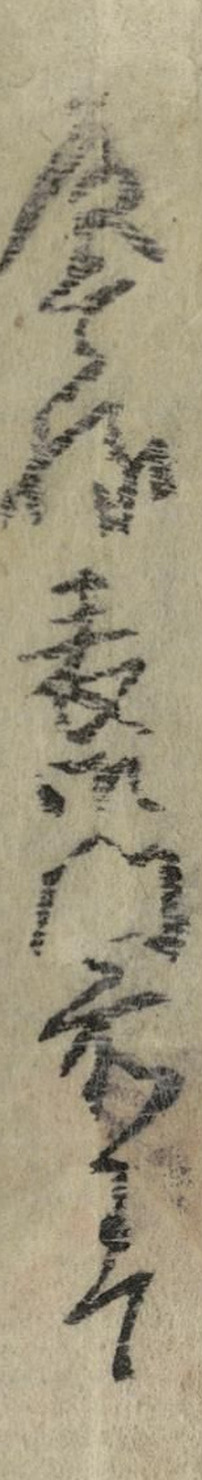藤堂様表御門前にて
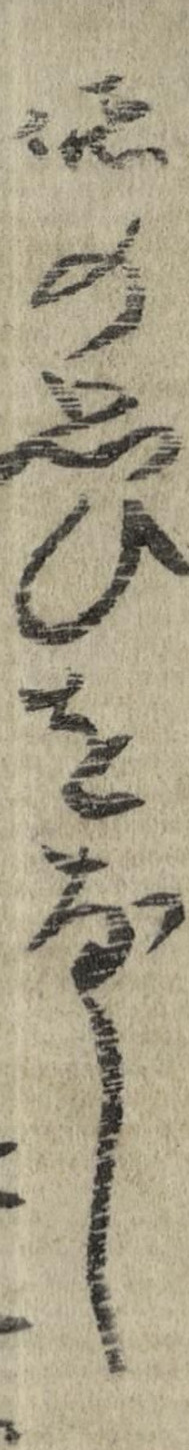堵の思ひをなし
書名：焼場所方角繪圖
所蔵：東京大学地震研究所図書室 Earthquake Research Institute Library, The University of Tokyo, JAPAN
